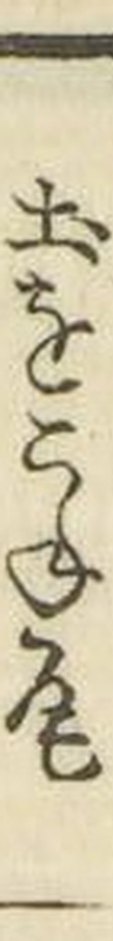土をこね瓦
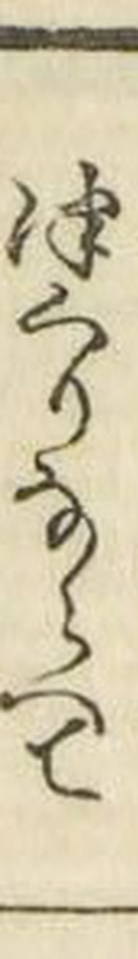つくりならへて
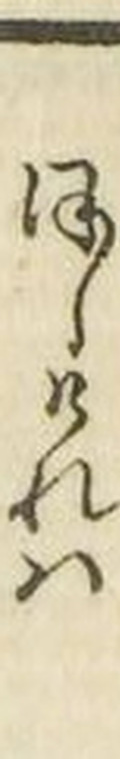ほしけれは
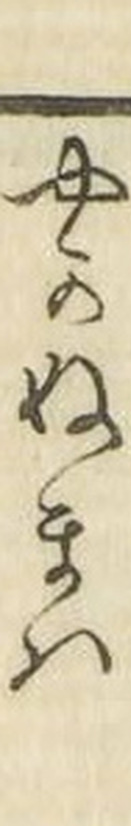やかぬまは
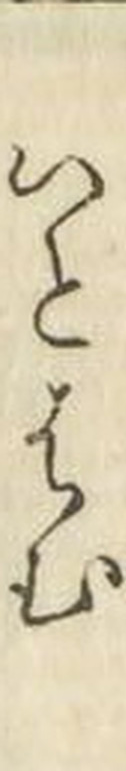いとはむ
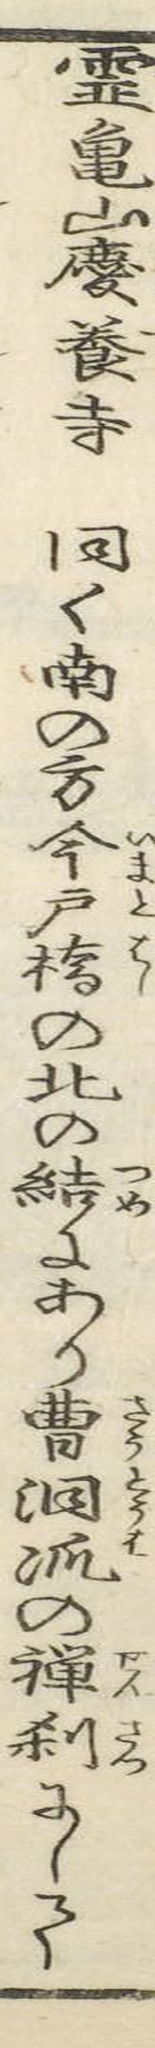霊亀山慶養寺同く南の方今戸橋の北の結にあり曹洞派の禅刹にして
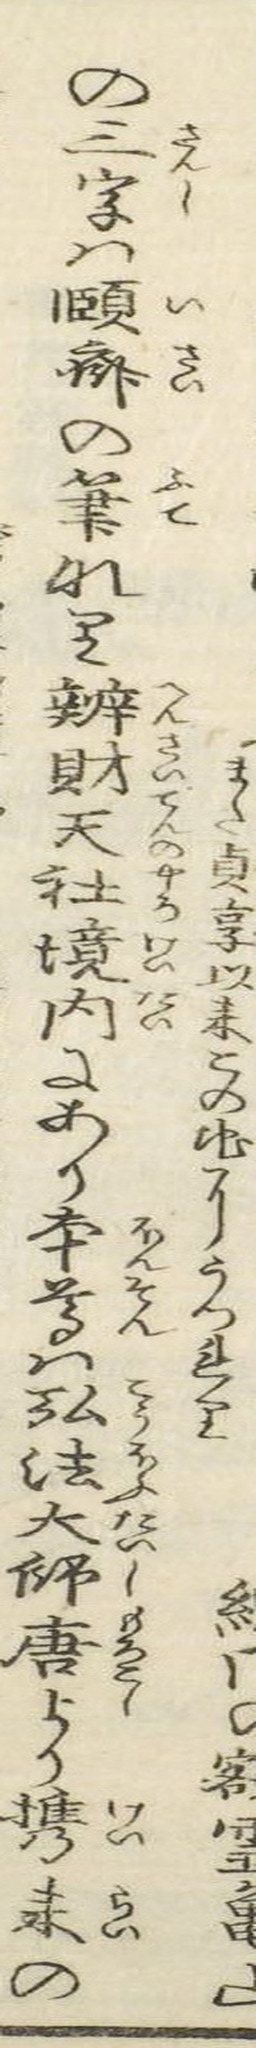の三字は頤斎の筆なり弁財天社境内にあり本尊は弘法大師唐より携来の
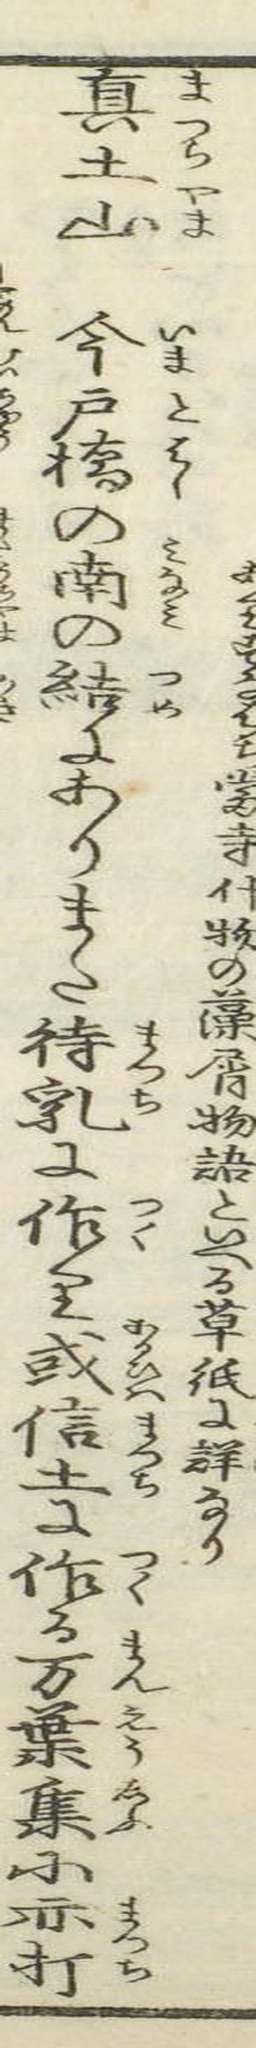真土山今戸橋の南の結にありまた待乳に作り或信土に作る万葉集に亦打
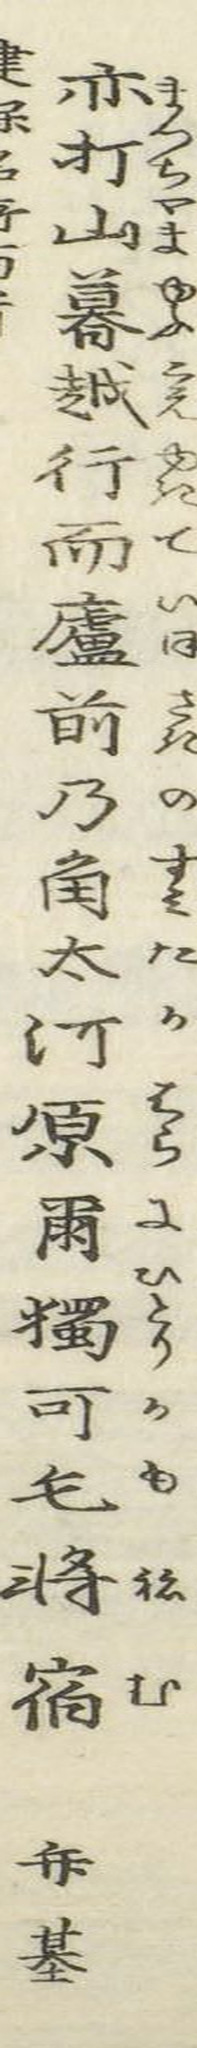亦打山暮越行而廬前乃角太河原爾独可毛将宿弁基
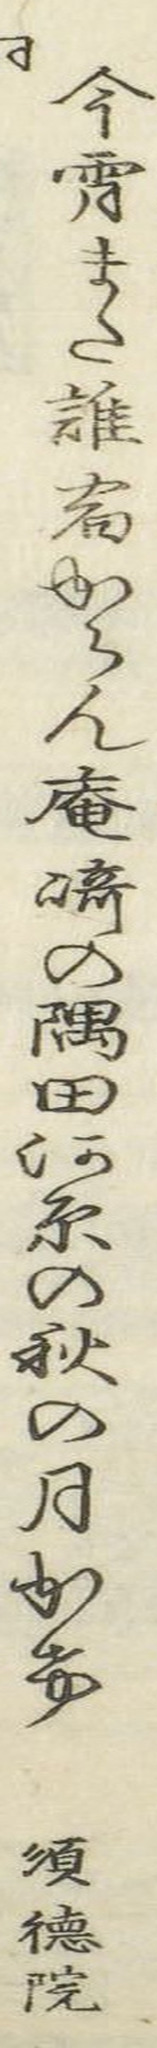今宵また誰宿からん庵崎の隅田河原の秋の月かけ須徳院
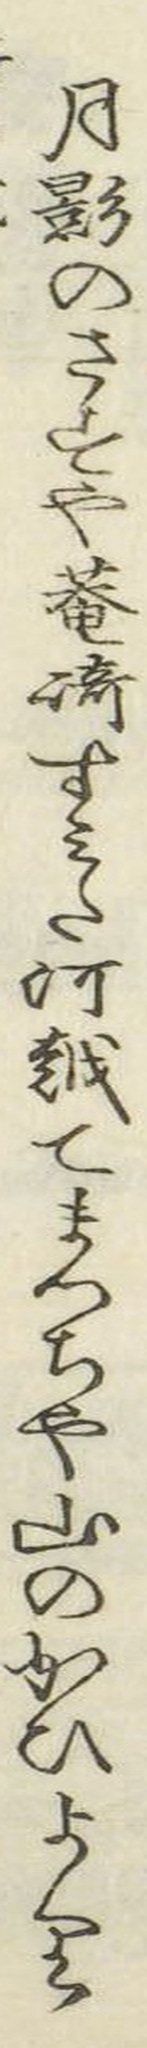月影のさすや菴崎すみた河越てまつちや山のかひより家隆
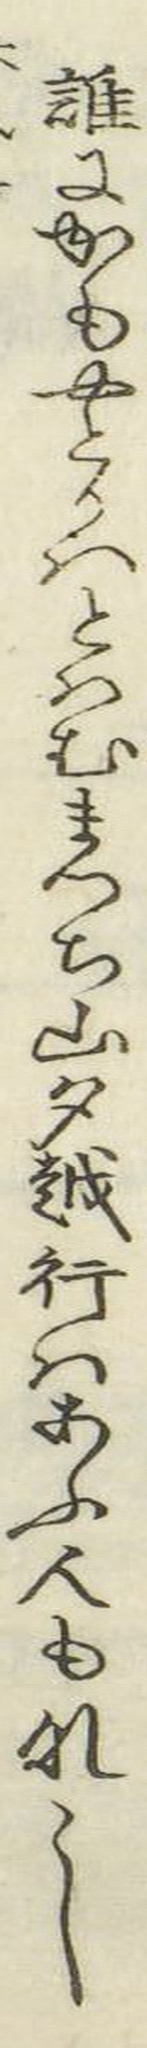誰にかもやとりはとはむまつち山夕越行はあふ人もなし定実
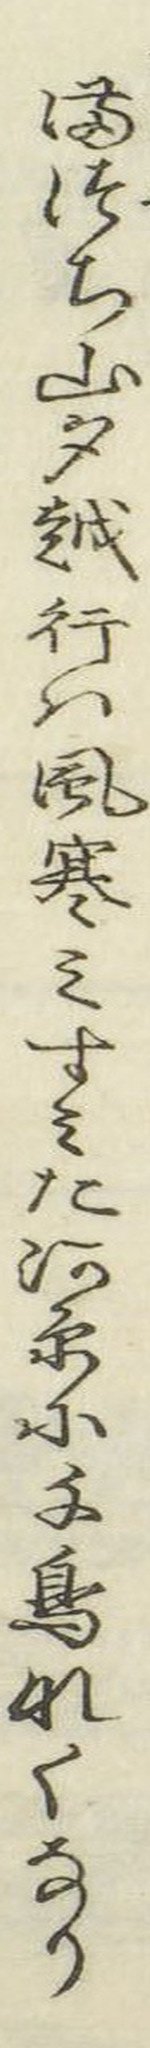まつち山夕越行は風寒みすみた河原に千鳥なくなり季広
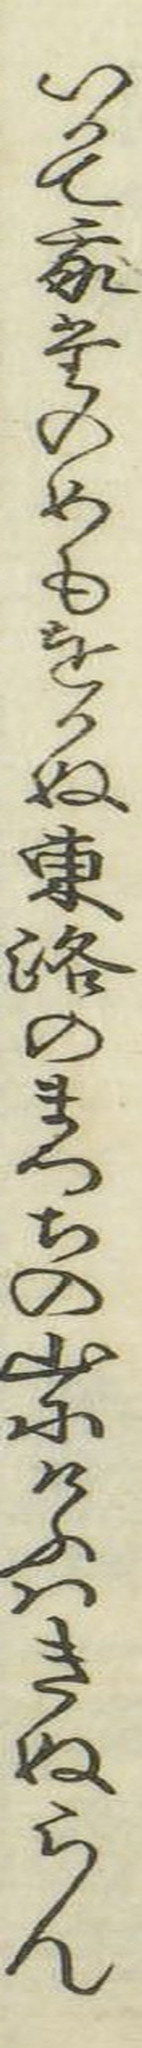いかて家たのめもをかね東路のまつちの山にけふはきぬらん同興准后

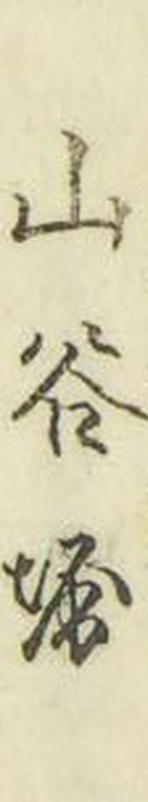山谷堀
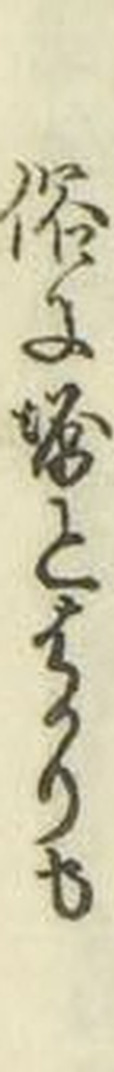俗に堀とはかりも
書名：江戸名所図会 20巻 巻之17
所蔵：東京学芸大学教育コンテンツアーカイブ
